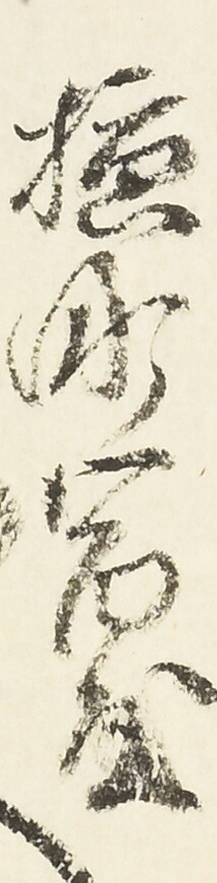横町塩屋
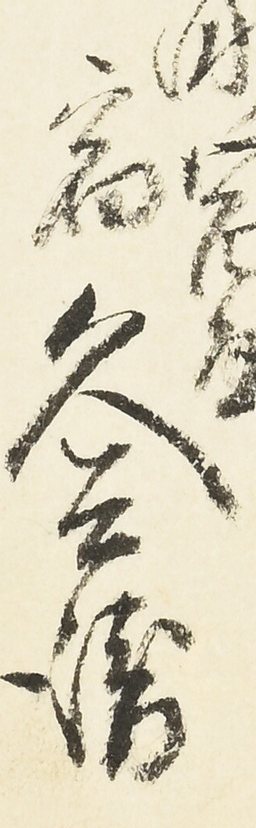宿久兵衛
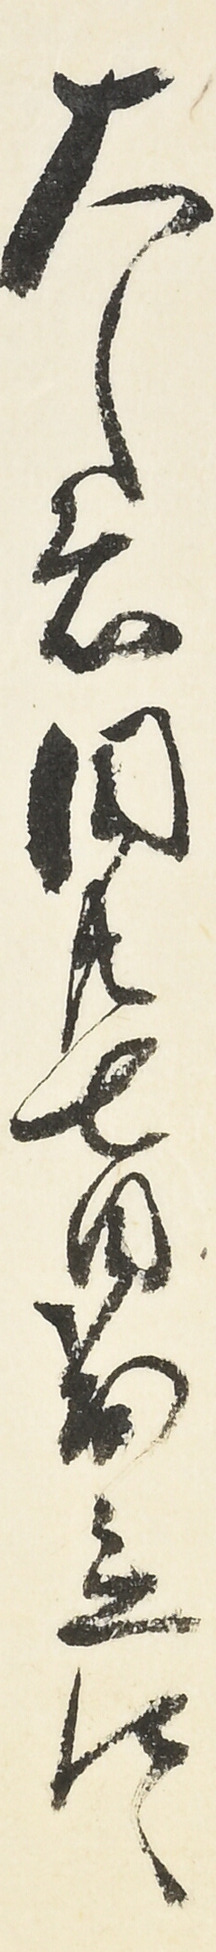右之者同廿七日出立仕候
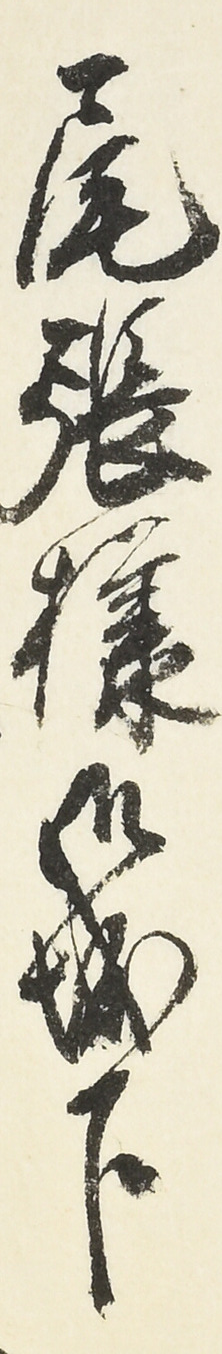尾張様御領分
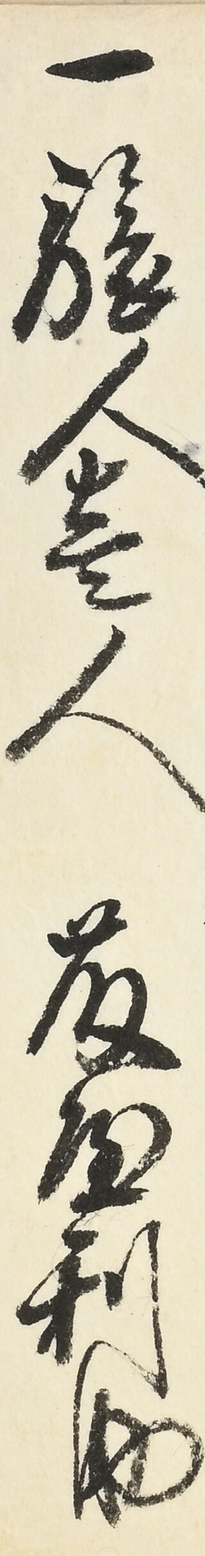一旅人壱人藤屋利助
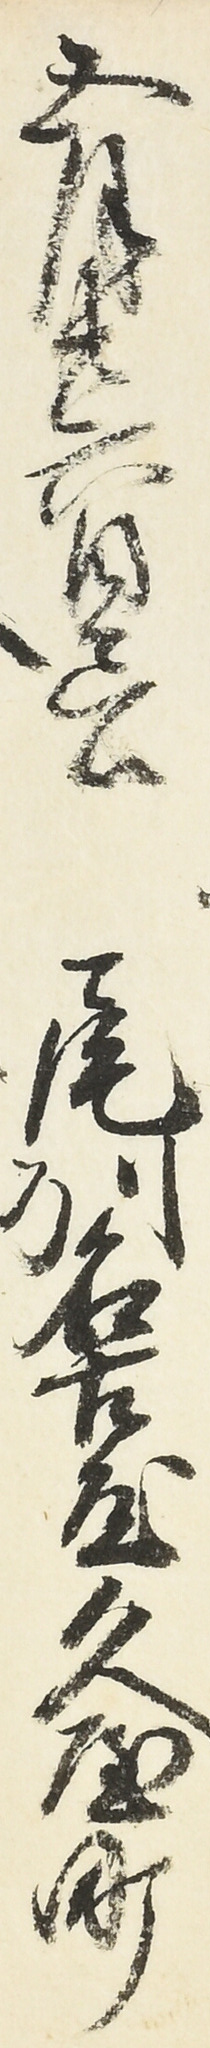五月廿六日着尾州名古屋久屋町
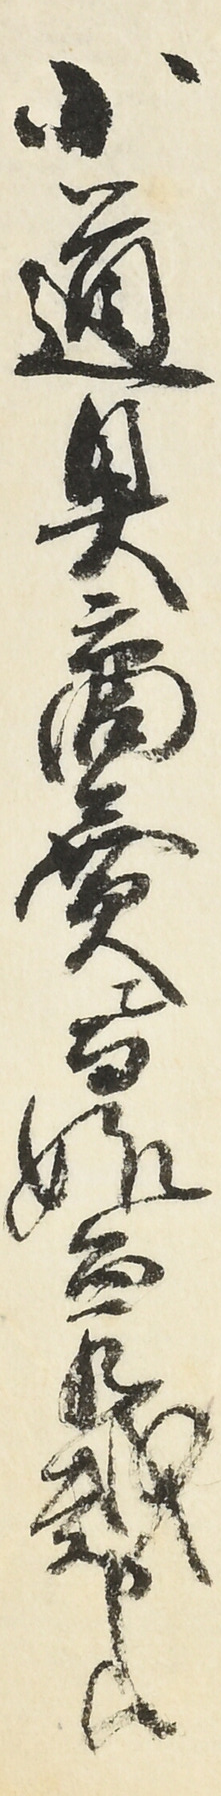小道具商売ニ而始而罷越申候

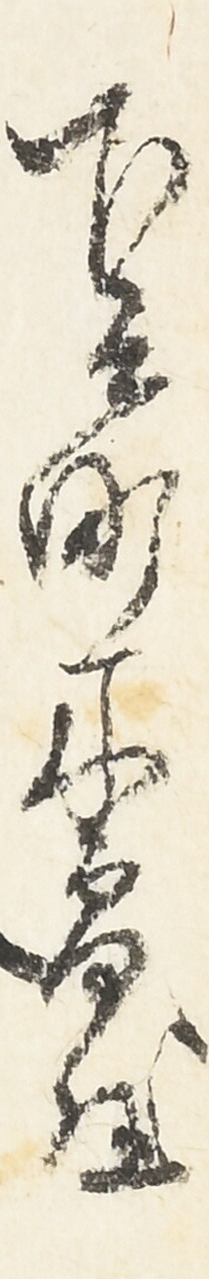下モ町木曽屋
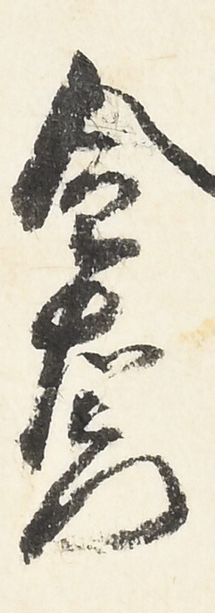金右衛門
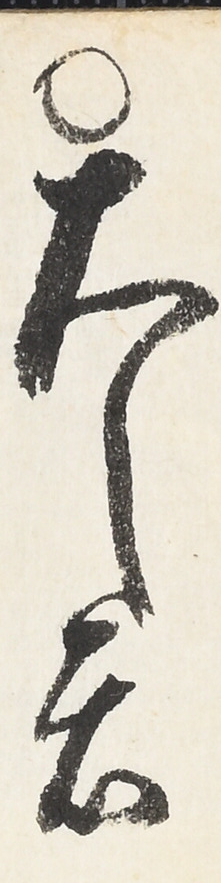〇右之者
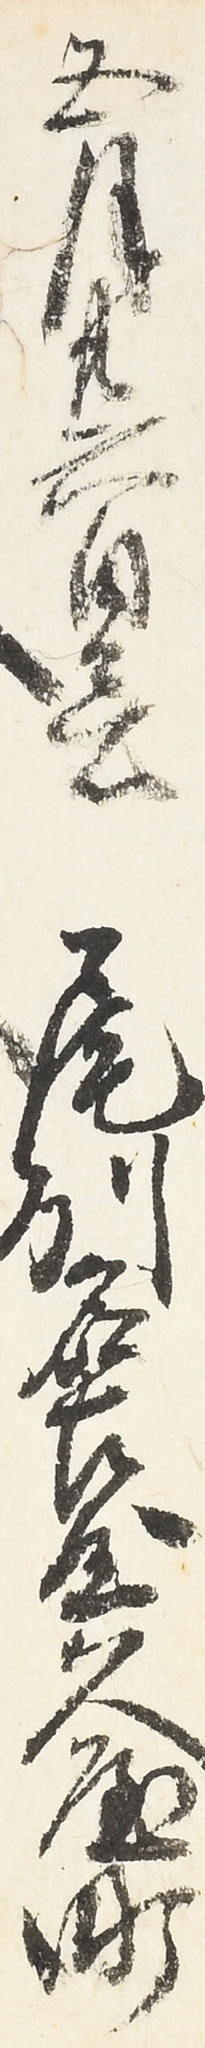五月廿六日着尾州名古屋久屋町
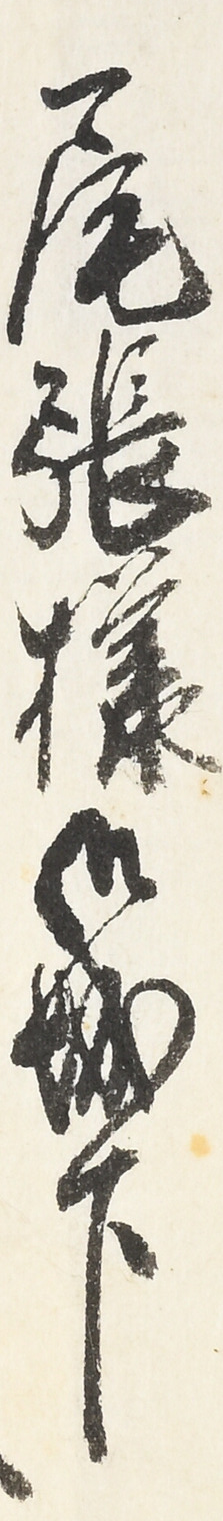尾張様御城下
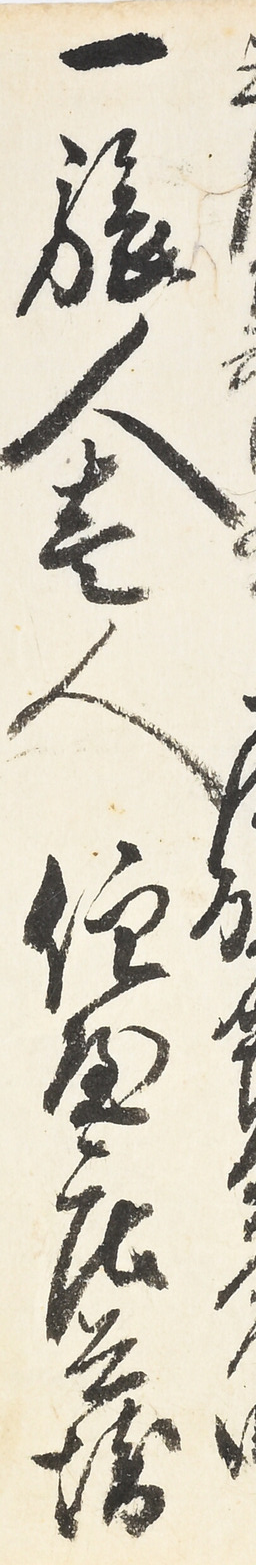一旅人壱人住屋庄兵衛
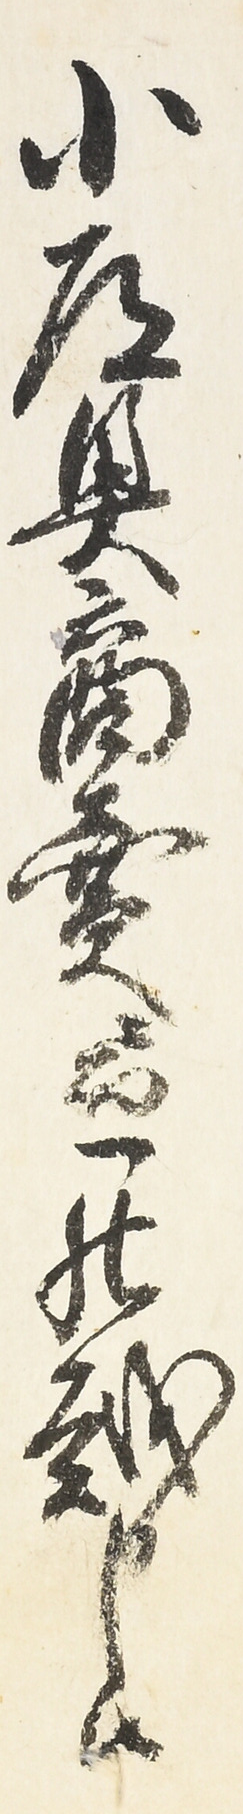小道具商売ニ而罷越申候
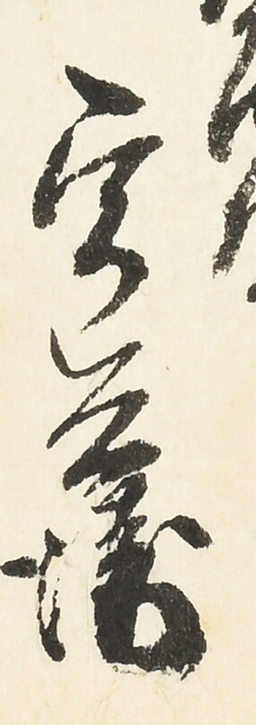宇兵衛
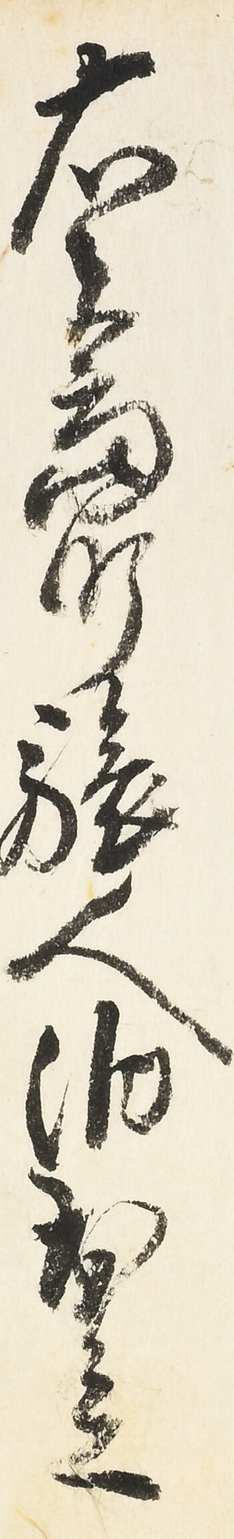右者当町旅人泊出立
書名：町中旅人泊控帳
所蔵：伊那市立高遠町図書館・合同会社AMANE
